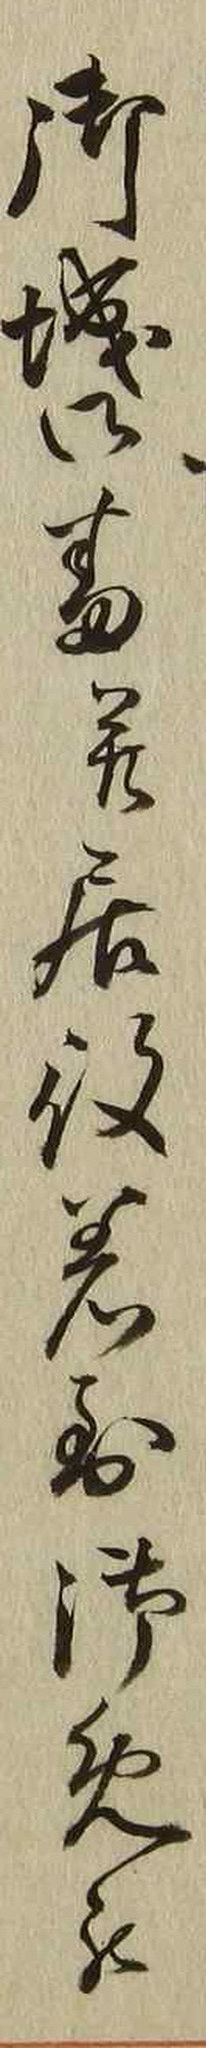御城御番幷居役着到御免被
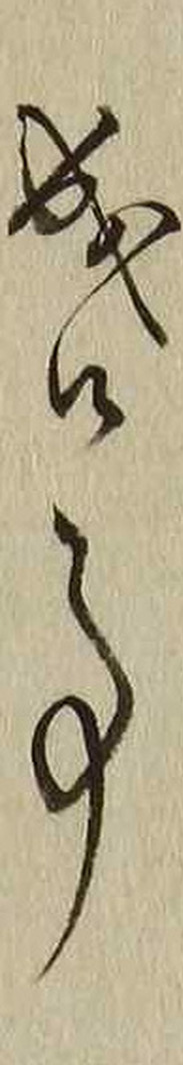成候事
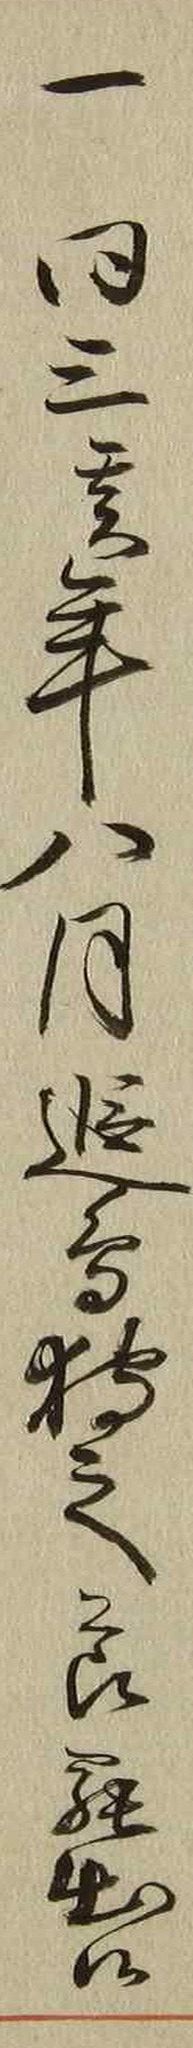一同三亥年八月追鳥狩之節罷出候
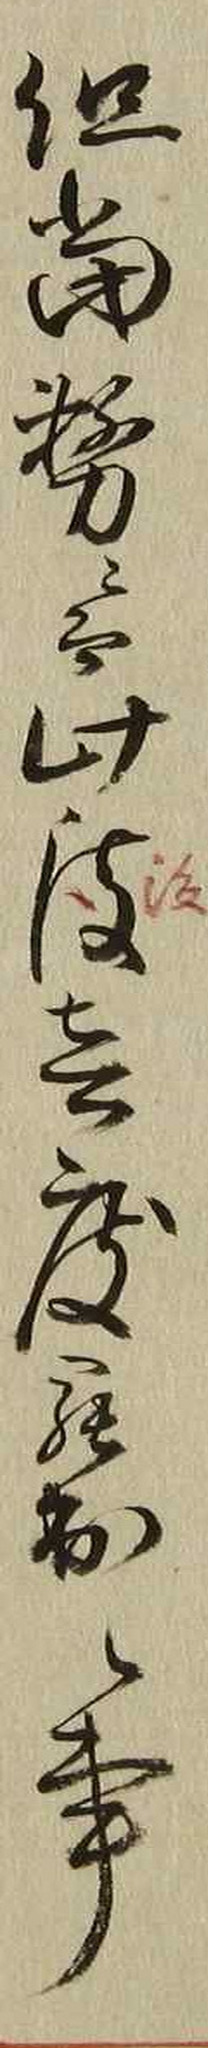但当務ニ而此後壱度罷出候事
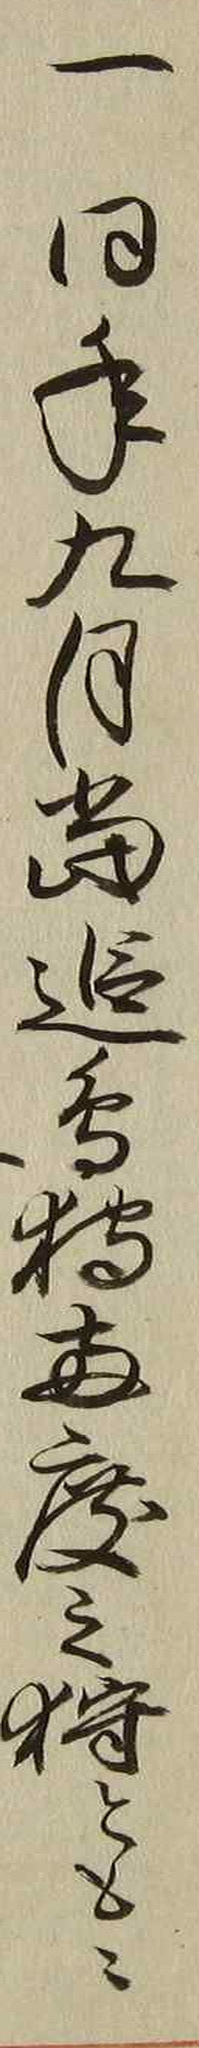一同年九月当追鳥狩両度之狩ともニ
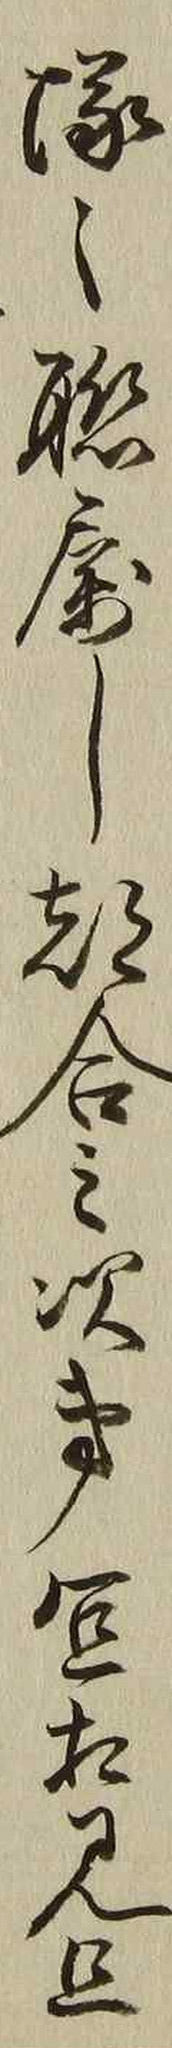隊々聯属し都合之次第宜相見且
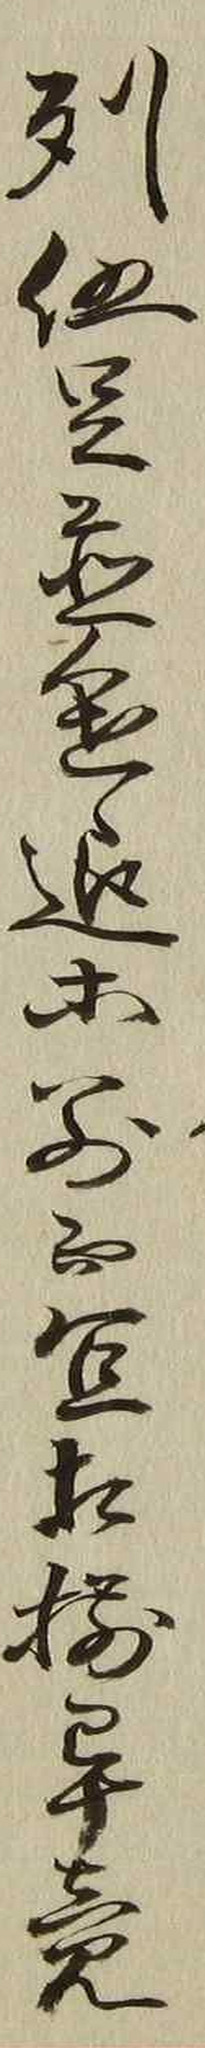列伍足並進退等別而相揃畢竟
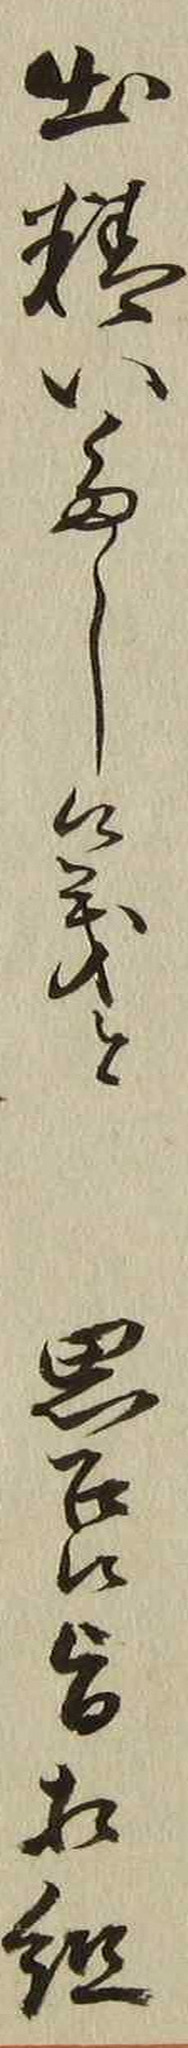出精いたし候義と思召候旨相組
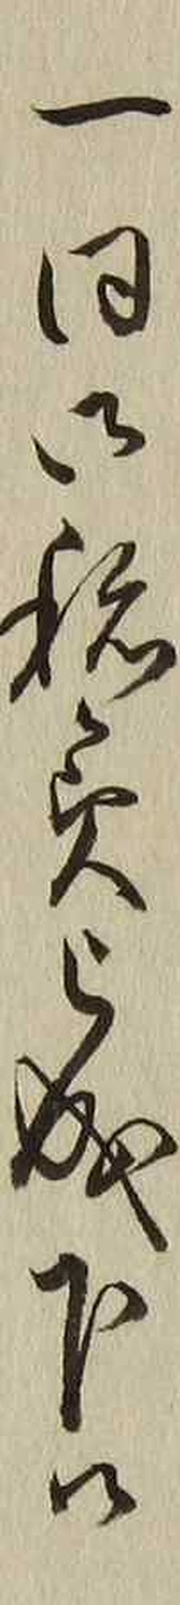一同御称美被成下候
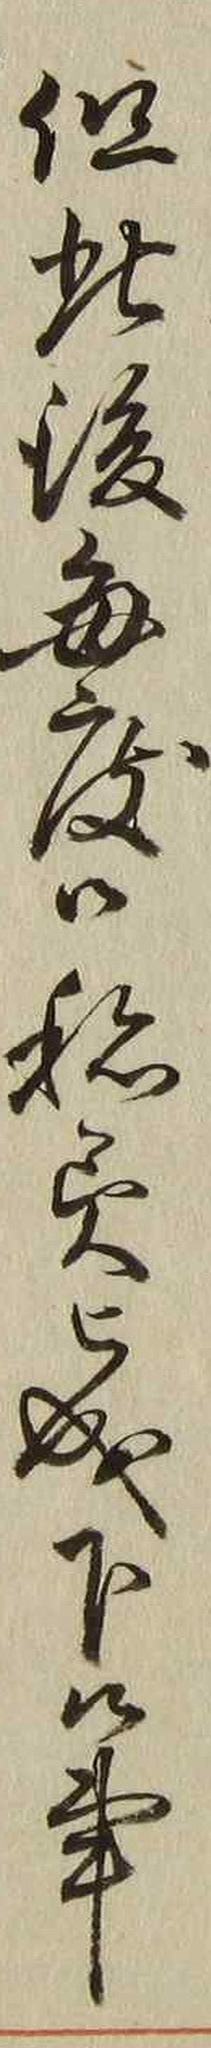但此後毎度御称美被成下候事
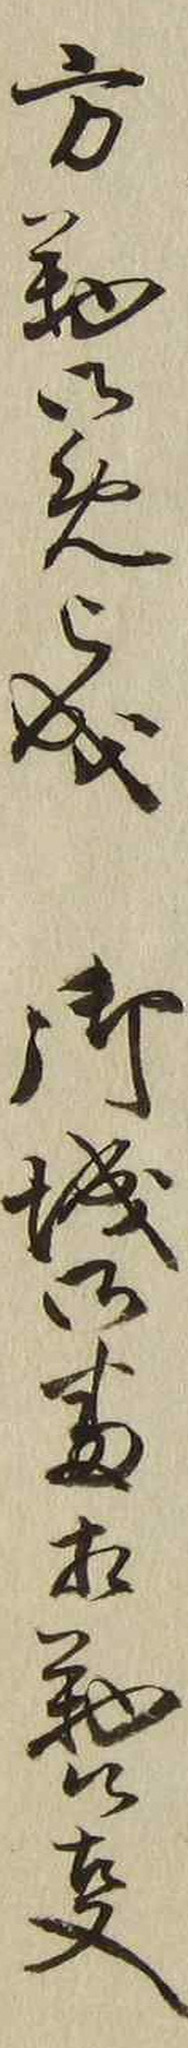方勤御免被成御城御番相勤候事
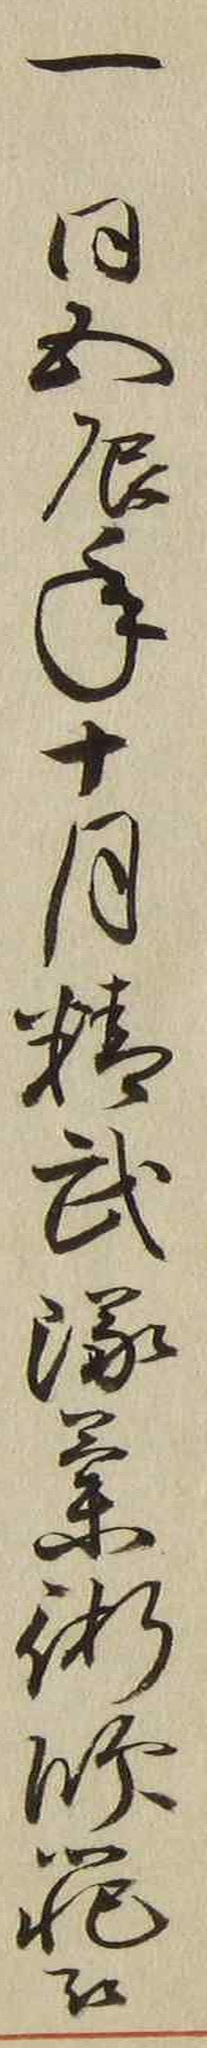一同五辰年十月精武隊気術師範被
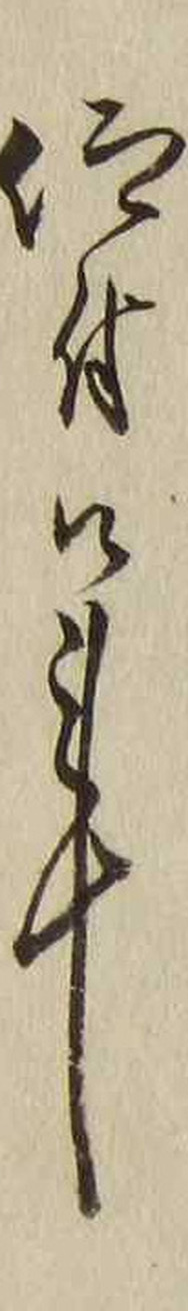仰付候事

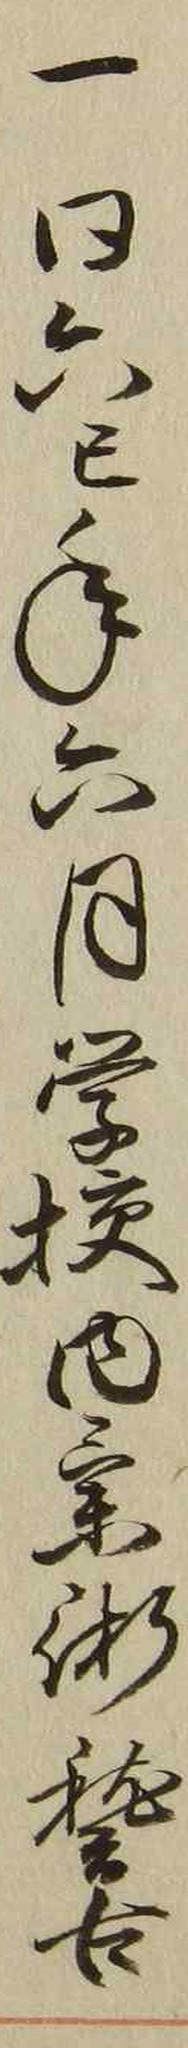一同六巳年六月学校内気術稽古
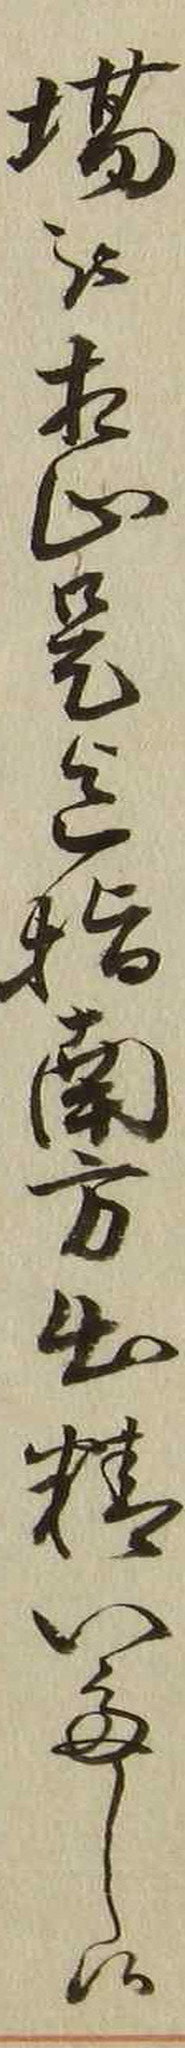場被相止是迄指南方出精いたし候
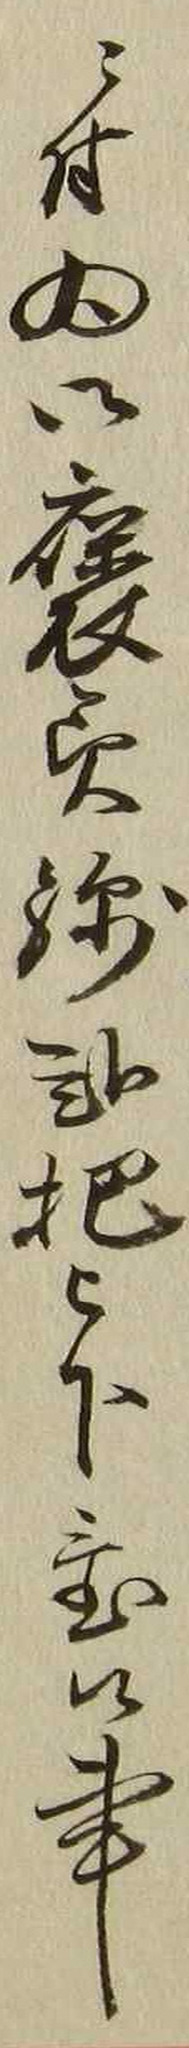ニ付為御褒美綿弐把被下置候事
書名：諸士系譜　巻之60　と之部3
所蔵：会津若松市立会津図書館
